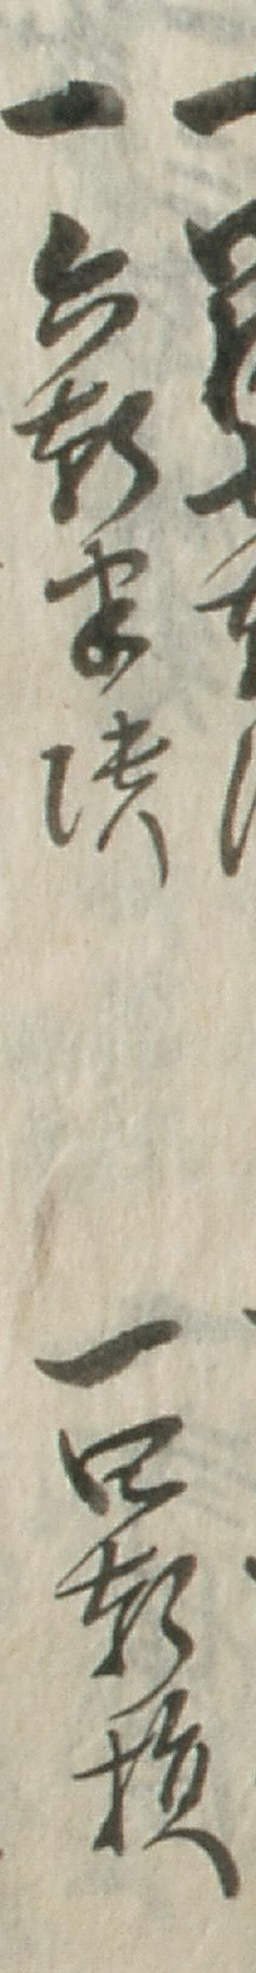一六軒半潰一四軒損
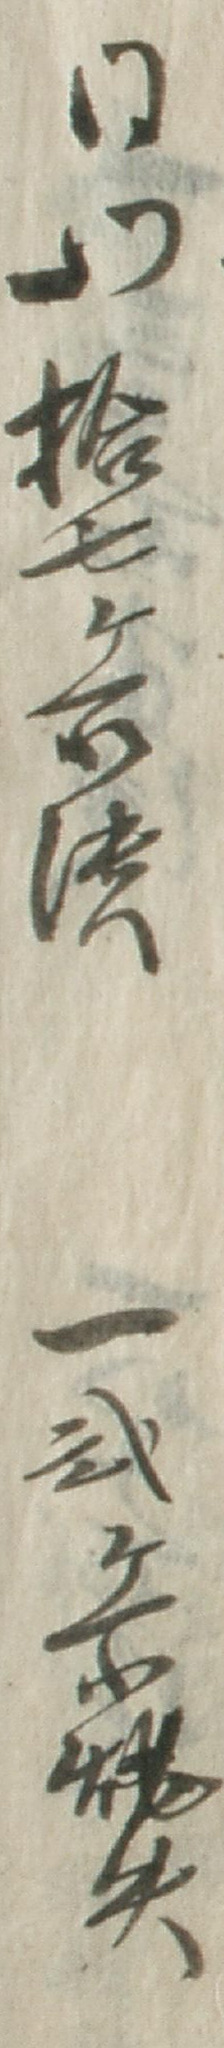一拾七ヶ所潰一弐ヶ所焼失

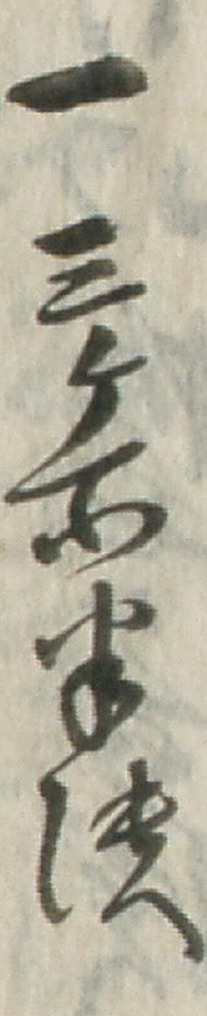一三棟半潰
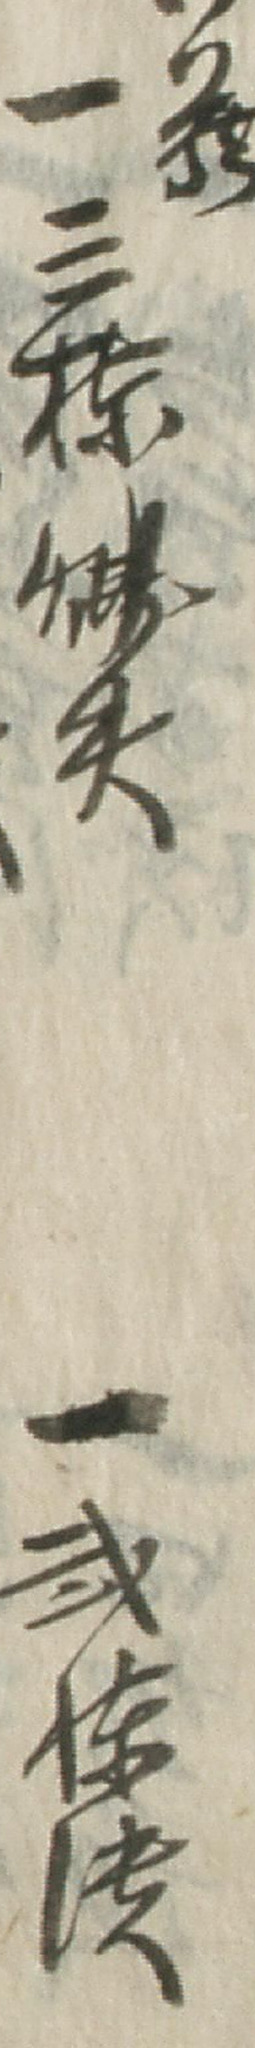一三棟焼失一弐棟潰
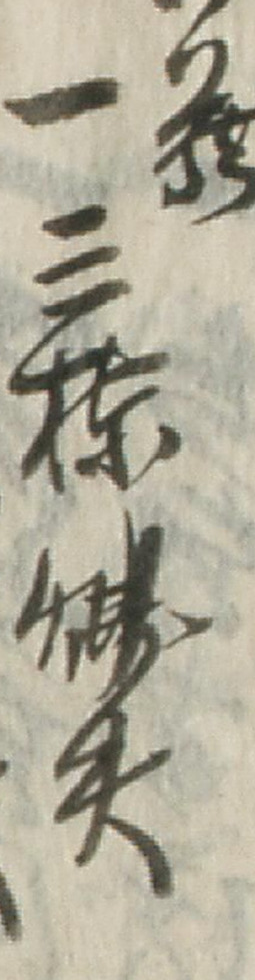一三棟半潰
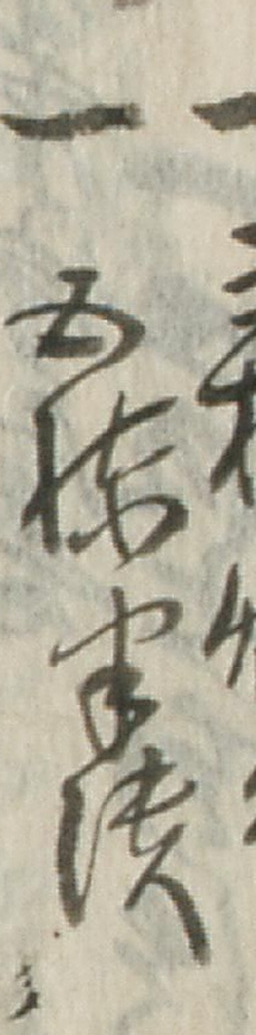一五棟半潰
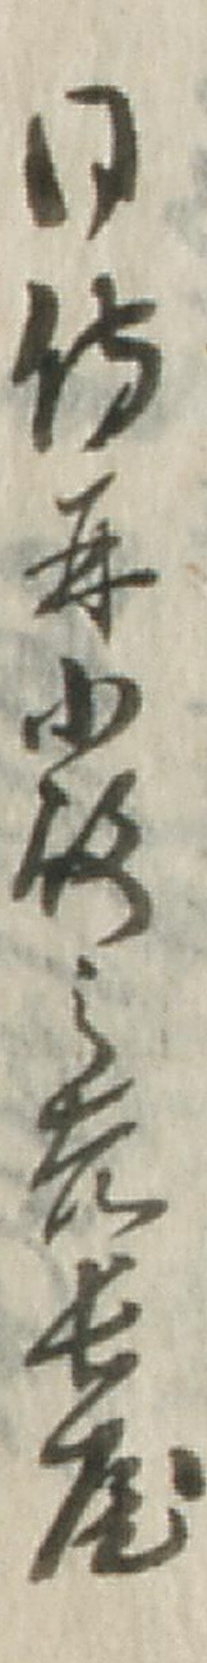同侍并小役之者長屋
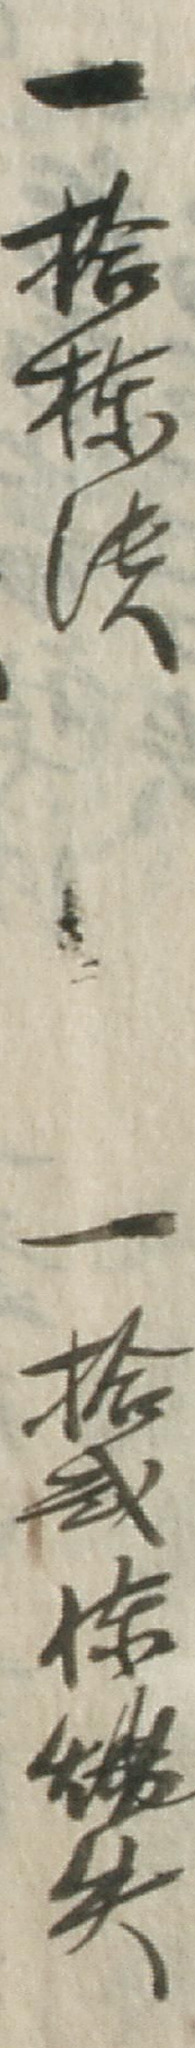一拾棟潰一拾弐棟焼失
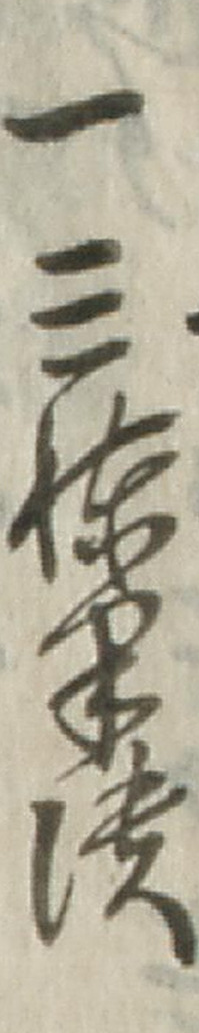一三棟半潰
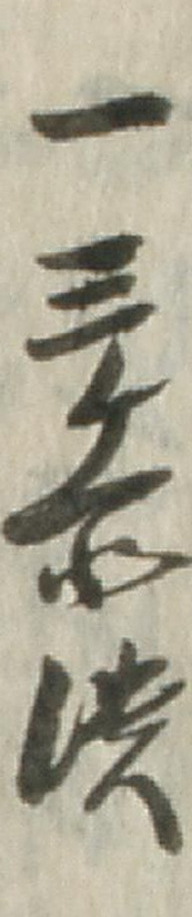一三棟半潰
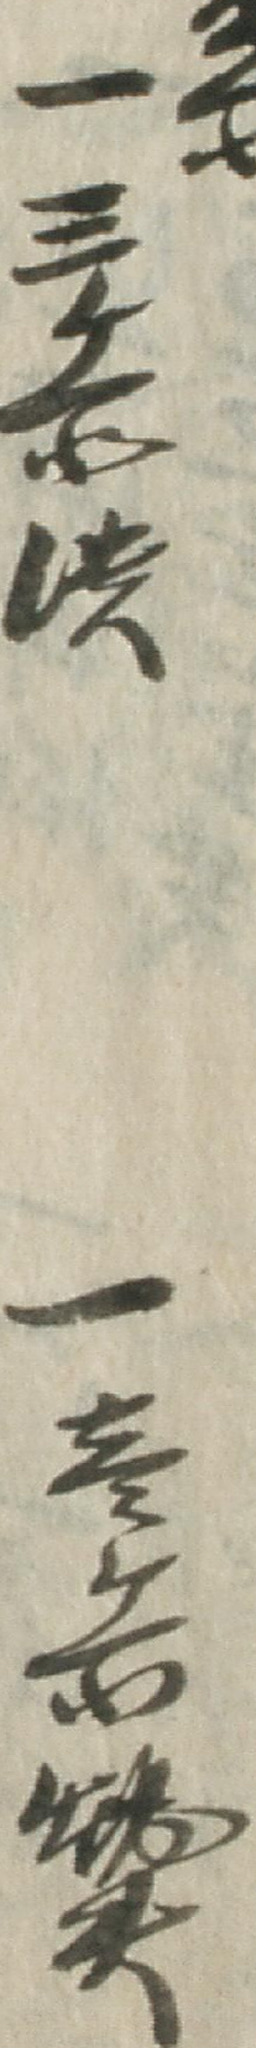一三ヶ所潰一壱ヶ所焼失
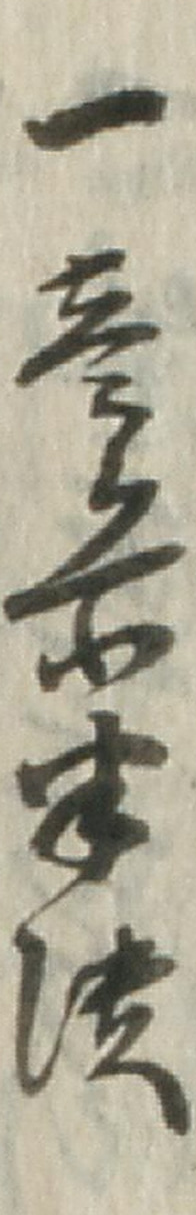門一ヶ所半潰
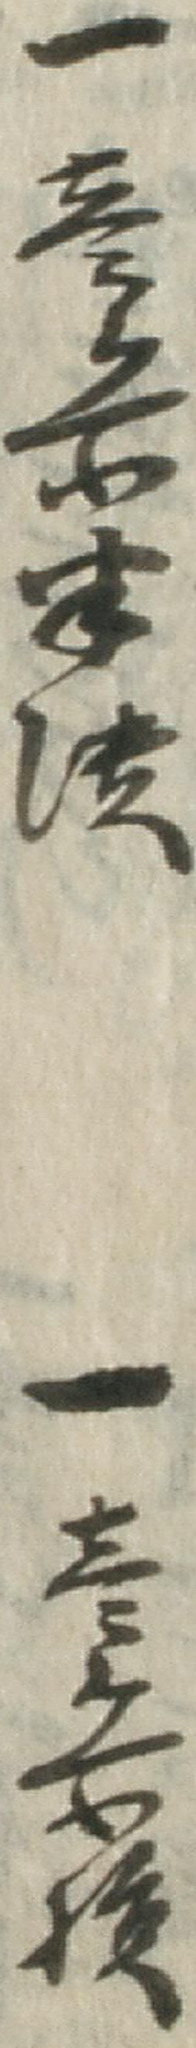一壱ヶ所半潰一壱ヶ所損
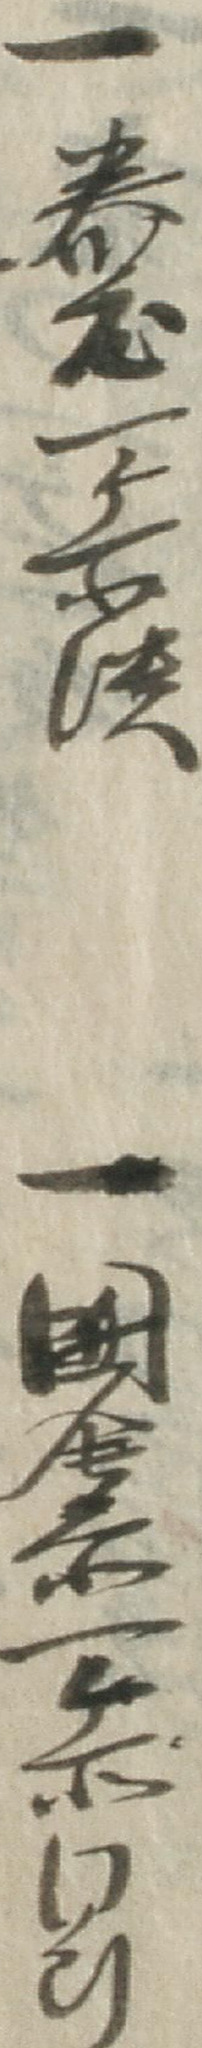一舂屋一ヶ所潰一囲舎所一ヶ所同断
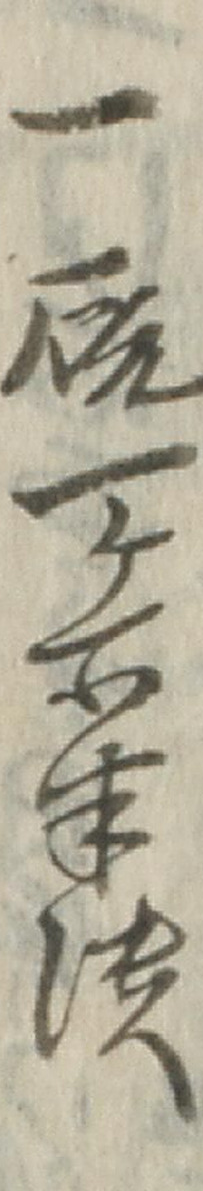門一ヶ所半潰
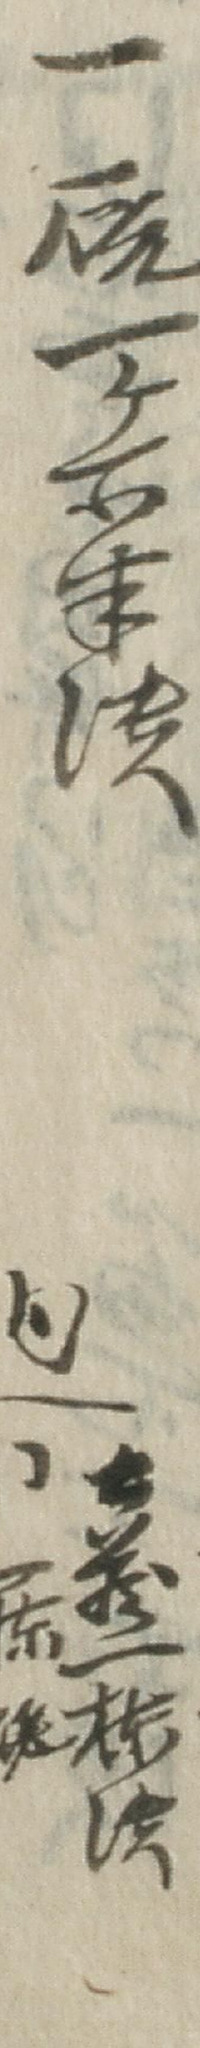一厩一ヶ所半潰内土蔵一棟潰
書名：信濃國地震實録記
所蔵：東京大学地震研究所図書室 Earthquake Research Institute Library, The University of Tokyo, JAPAN
